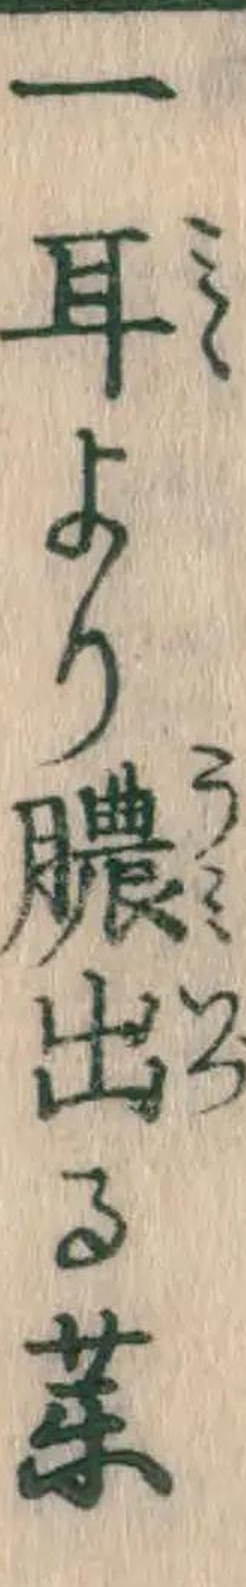一耳より膿出る薬
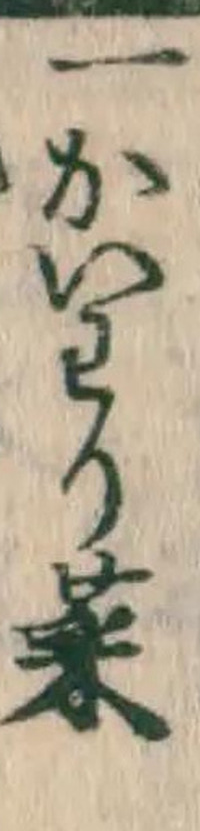一かいわり菜
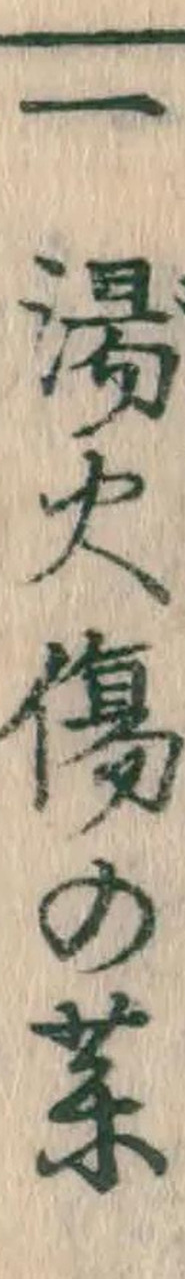一湯火傷の薬
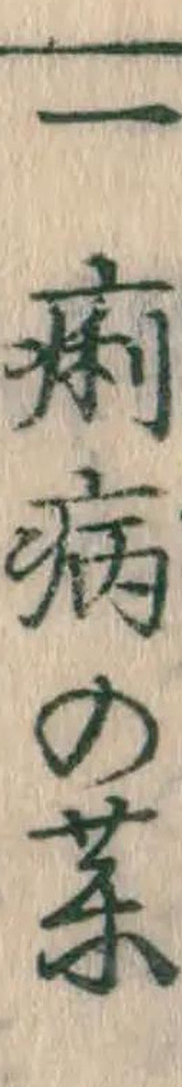一癜の薬
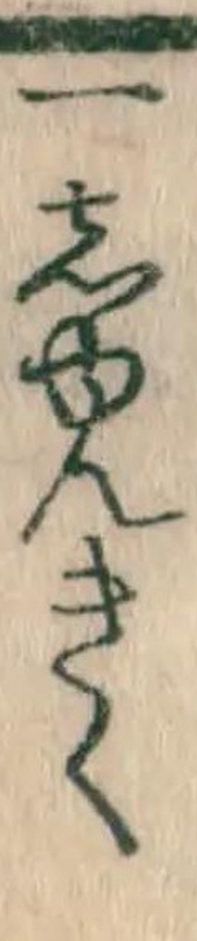一しゆんきく

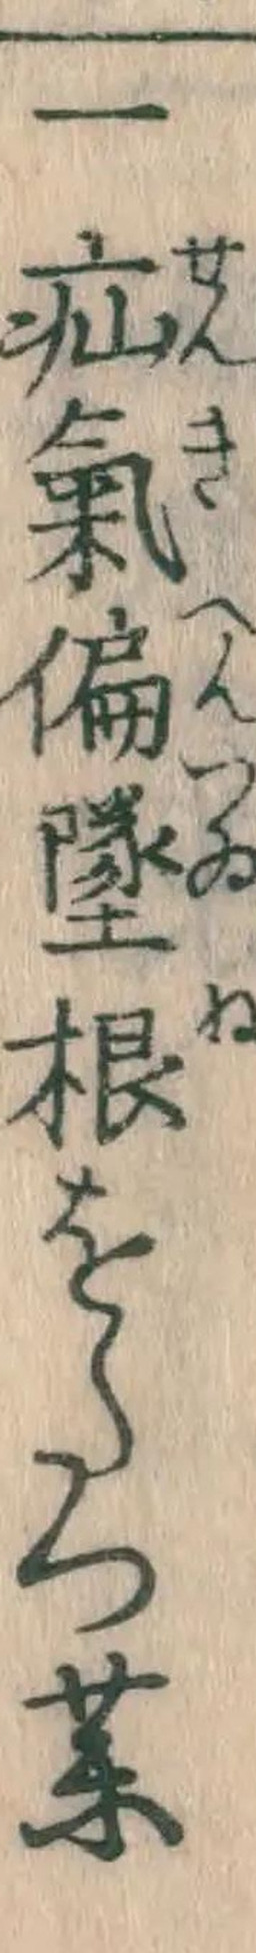一疝気偏墜根をたつ薬
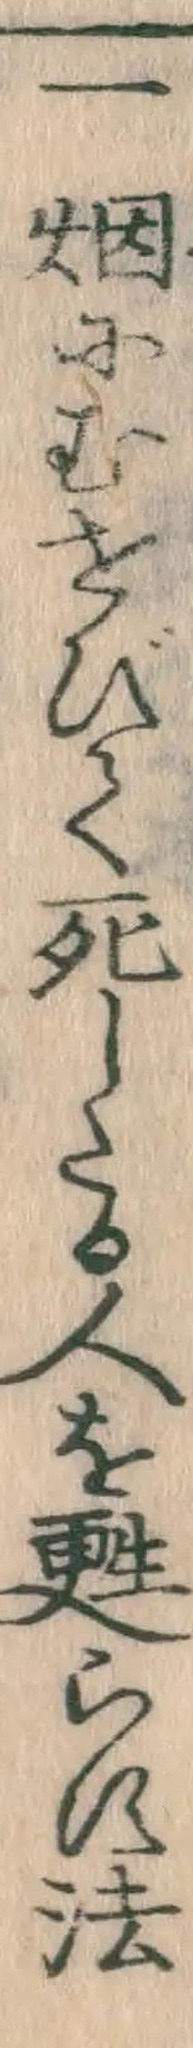一烟にむせびて死したる人を甦らす法
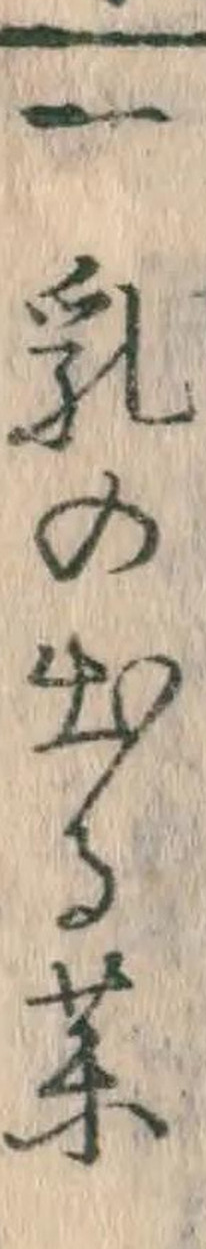一乳の出る薬
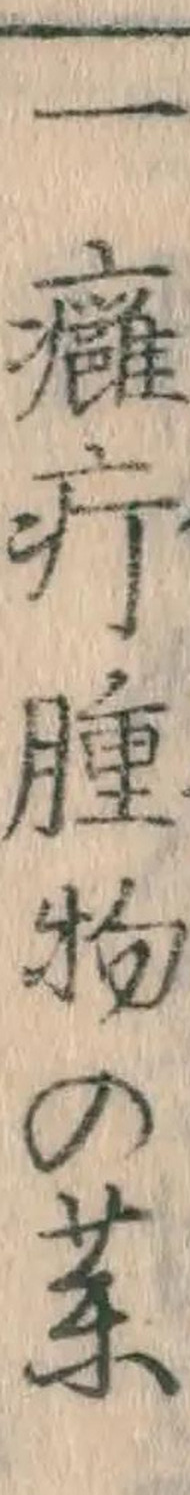一癰疔腫物の薬
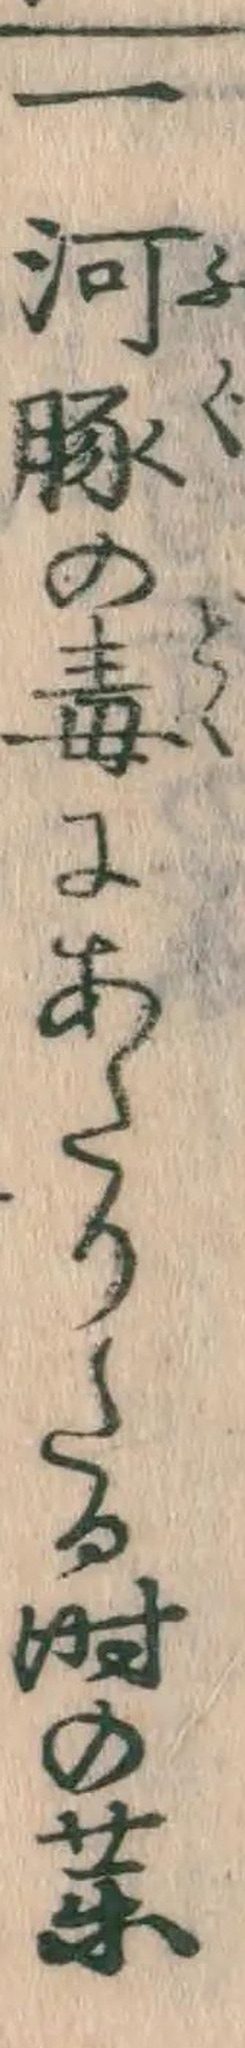一河豚の毒にあたりたる時の薬
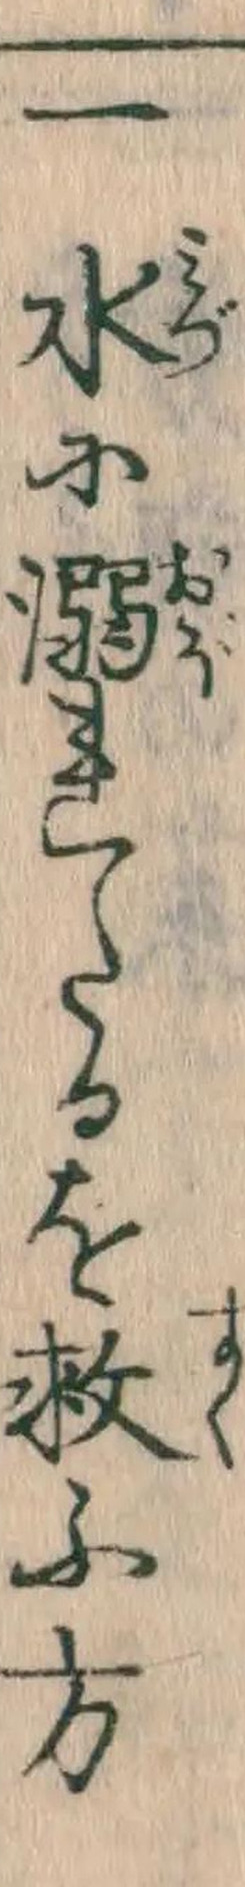一水に溺れたるを救ふ方
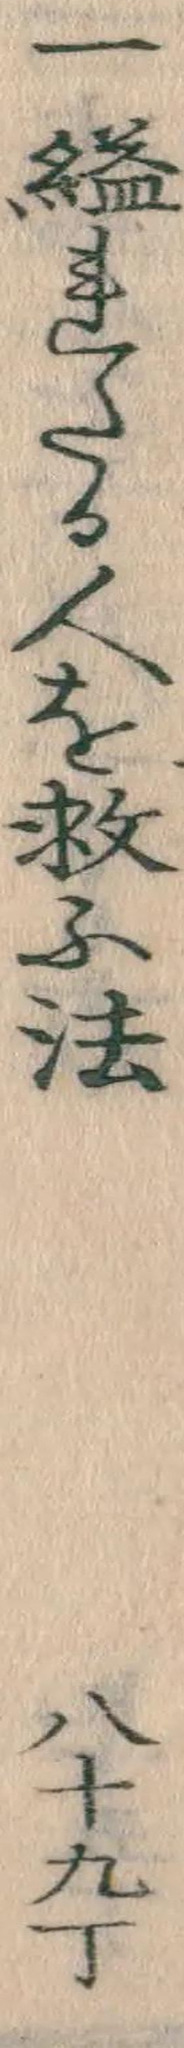一縊れたる人を救ふ法八十九丁
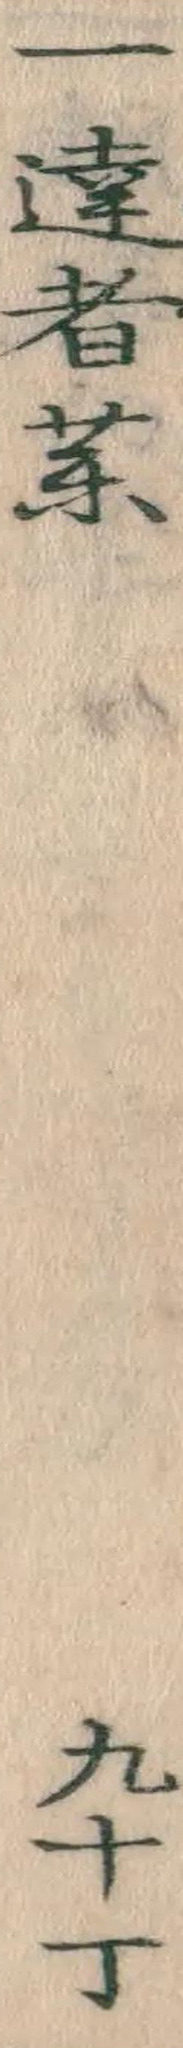一達者薬九十丁
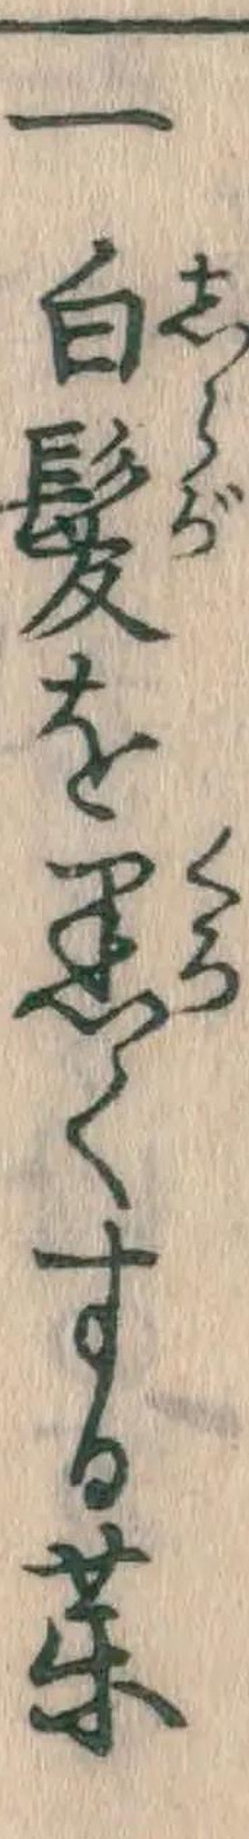一白髪を黒くする薬
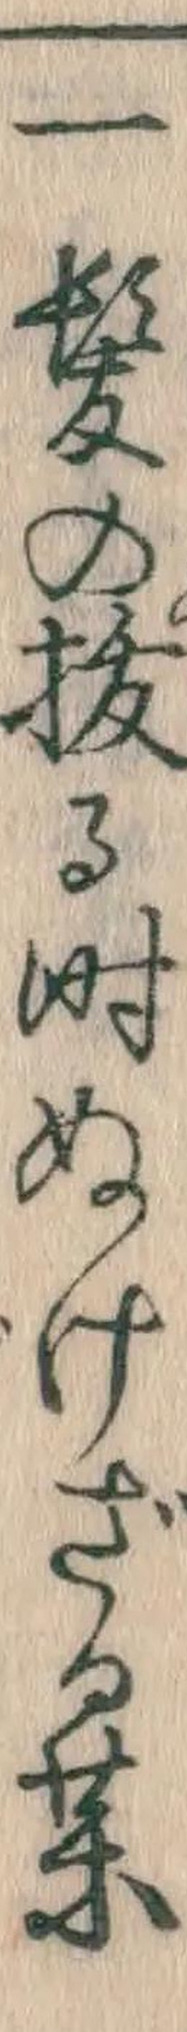一髪の抜る時ぬけざる薬
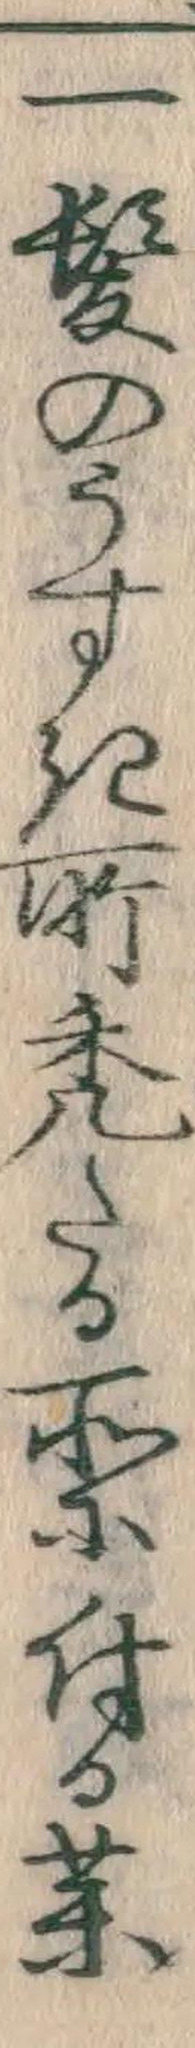一髪のうすき所禿たる所に付る薬
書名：広益秘事大全 3巻. [1]
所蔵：国立国会図書館 National Diet Library, JAPAN
